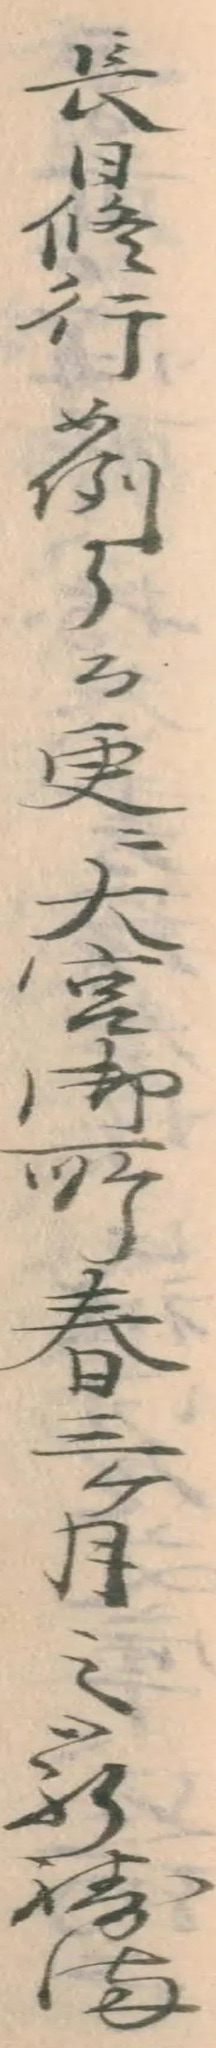長日修行如例了而更ニ大宮御所春三ケ月之御祈祷満
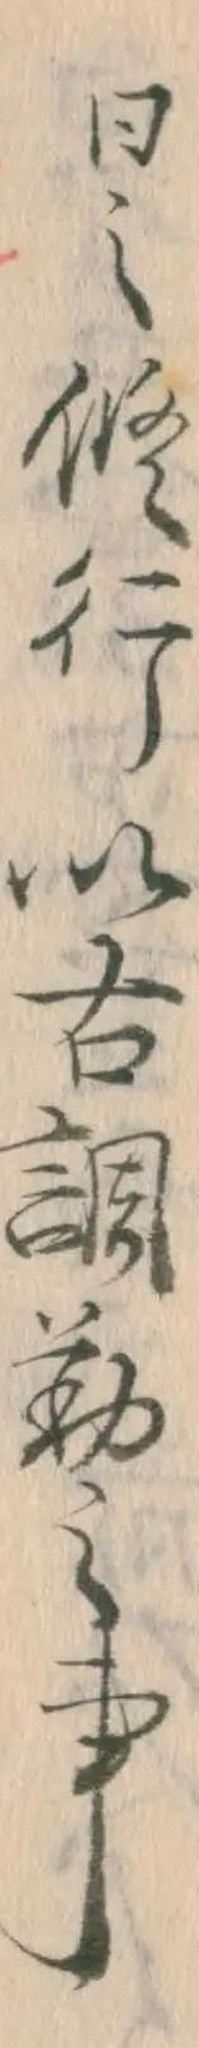日之修行以古調勤之事
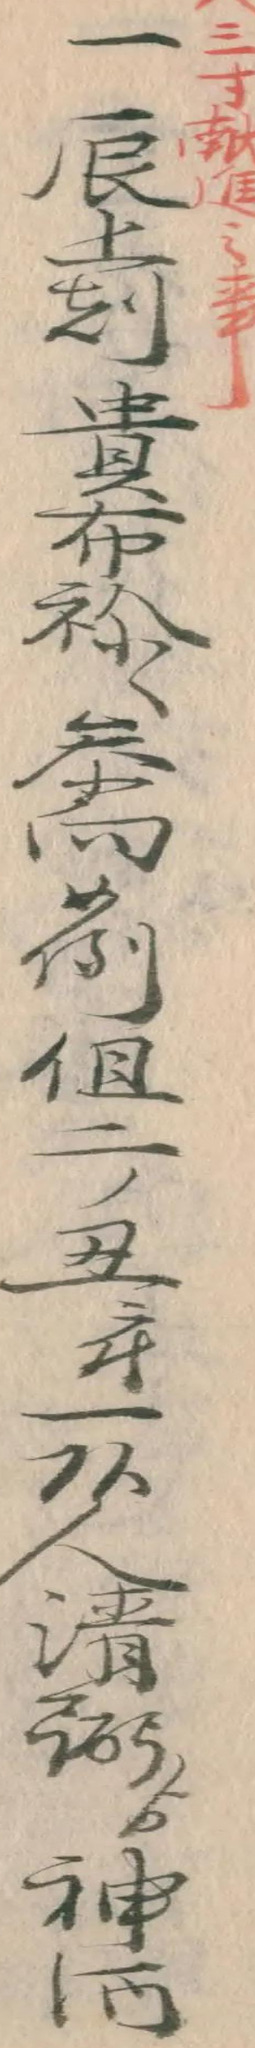一辰上刻貴布祢へ参向如例但二ノ丑ニ付一候人清弼ゟ神酒
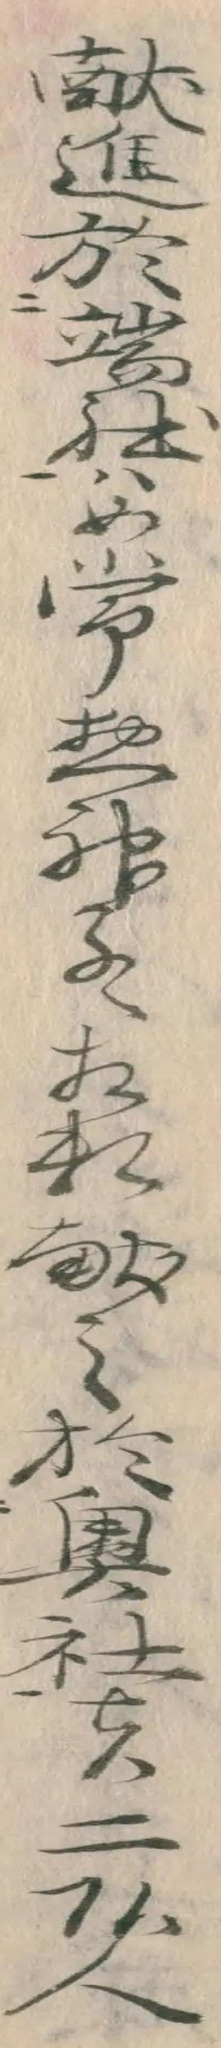献進於端社ハ如常惣神子へ相頼献之於奥社は二頭人
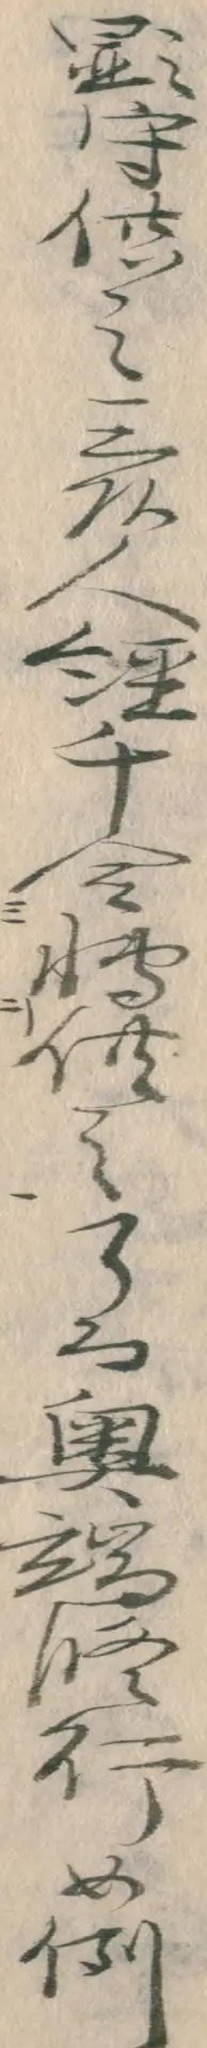顕守供之三頭人経千令轉供之了而奥端修行如例
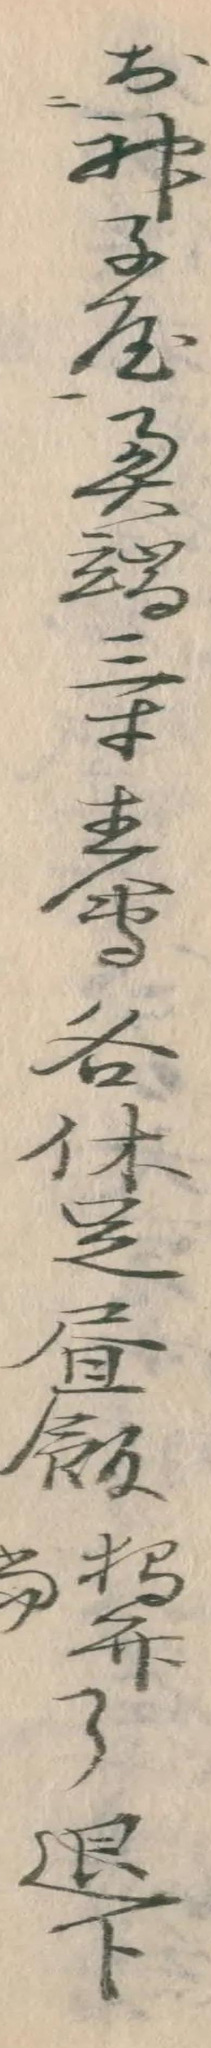於神子屋奥端三寸直會各休足昼飯独弁當了退下
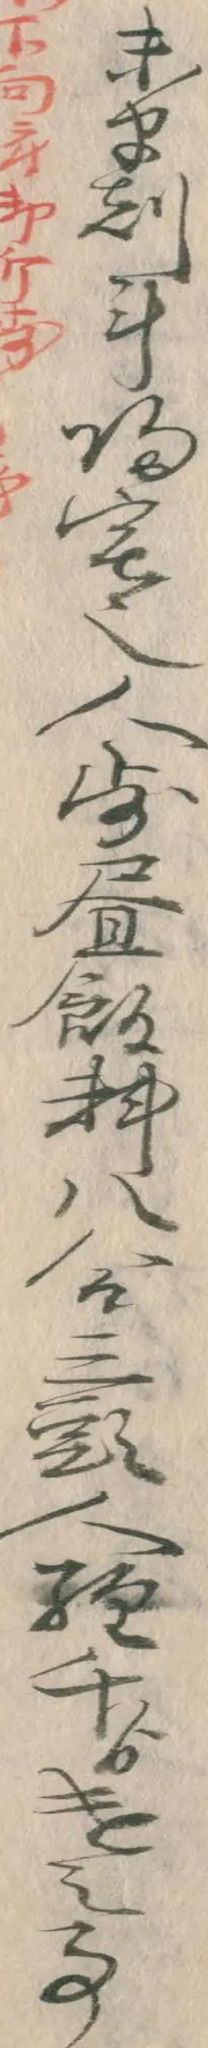未半刻斗帰宅也人歩昼飯料八合三頭人軽千ゟ遣之事
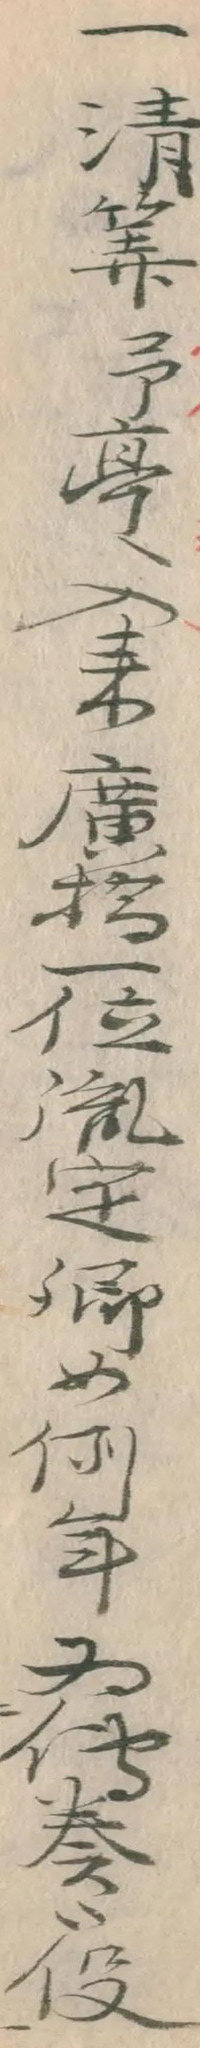一清算予亭へ入来廣橋一位胤定卿如例年為傳奏御役
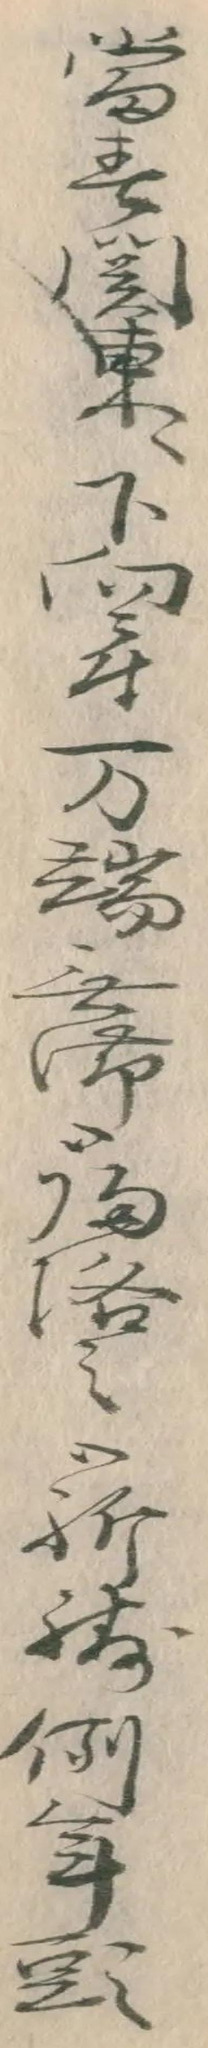當春関東へ下向ニ付万端無滞御帰洛之御祈祷例年頭
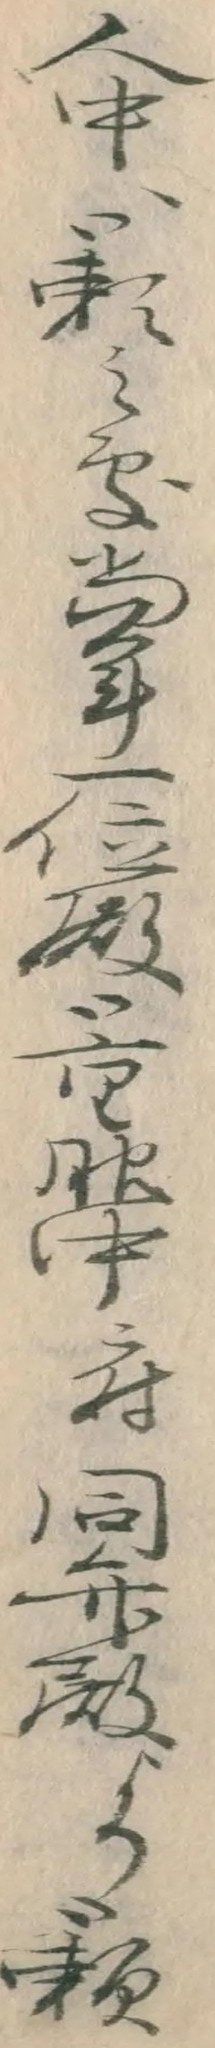人中へ御頼之處當年一位殿御重服中ニ付同弁殿より御頼

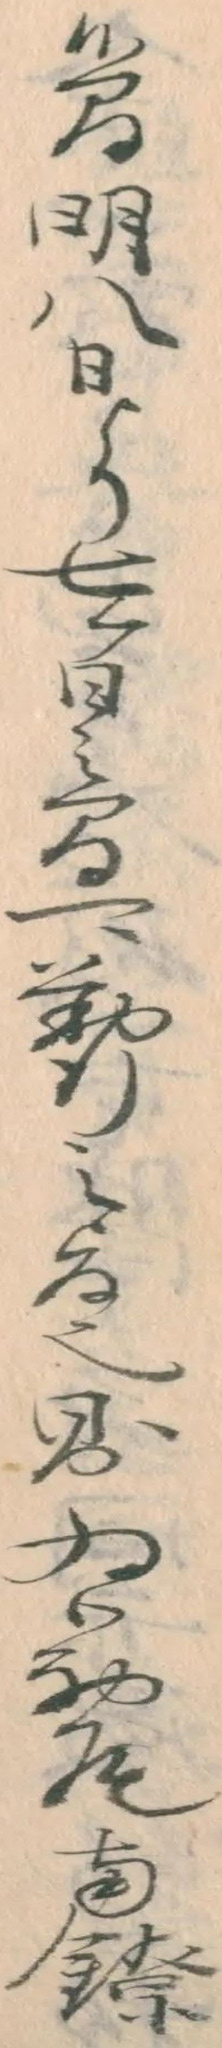候間明八日より七ケ日之間可勤之旨也則為御勤尾南鐐
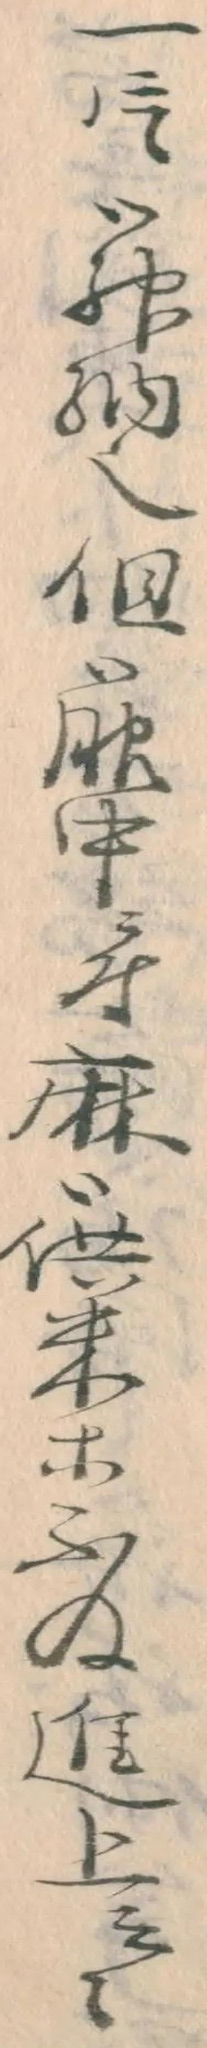一片御神納之但御服中ニ付麻御供米等不及進上云々
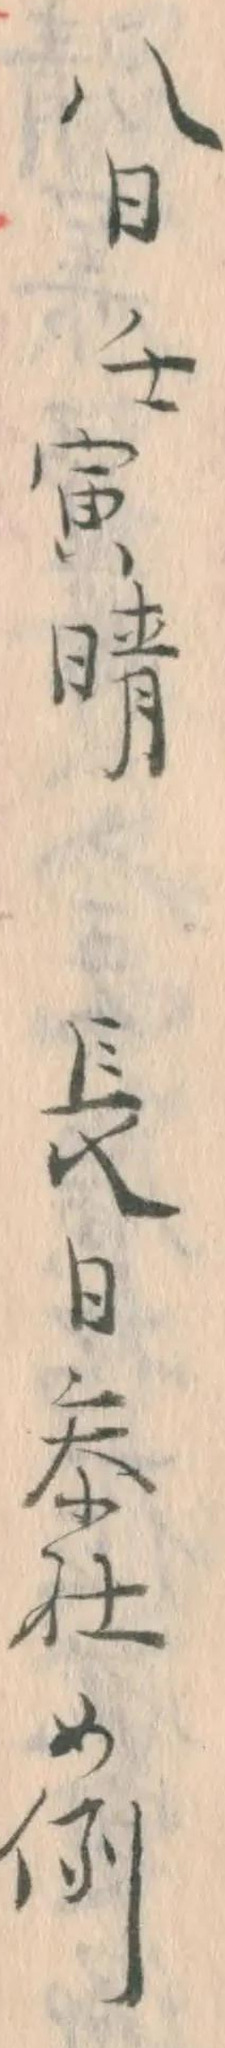八日壬寅晴長日参社如例
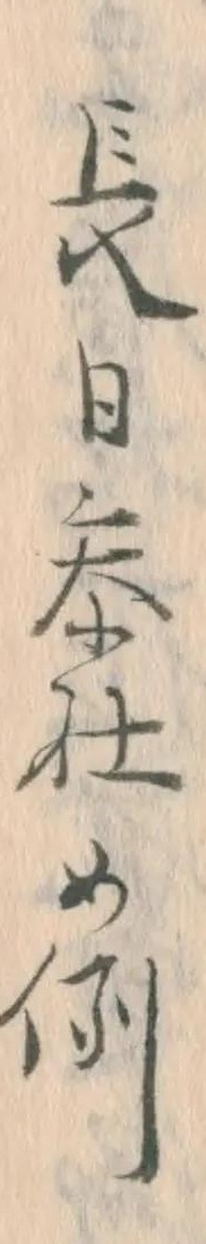一長日参社如例
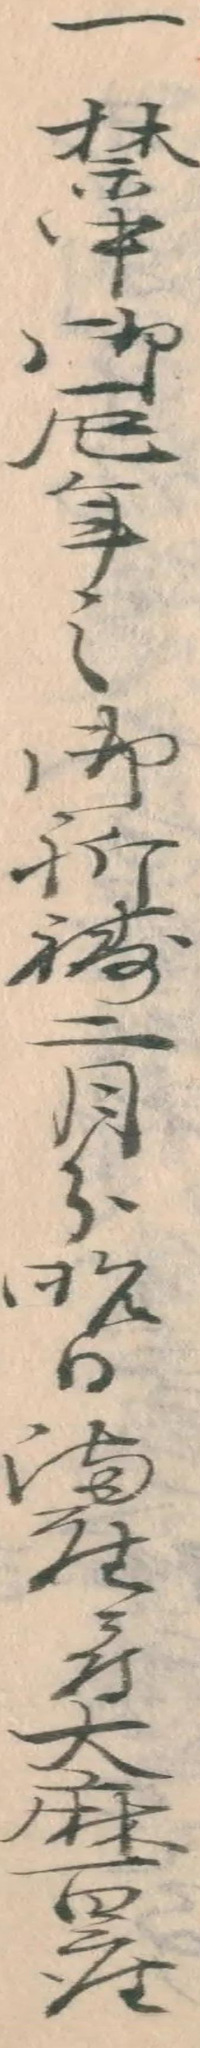一禁中御厄年之御祈祷二月分昨日満座ニ付大麻百座
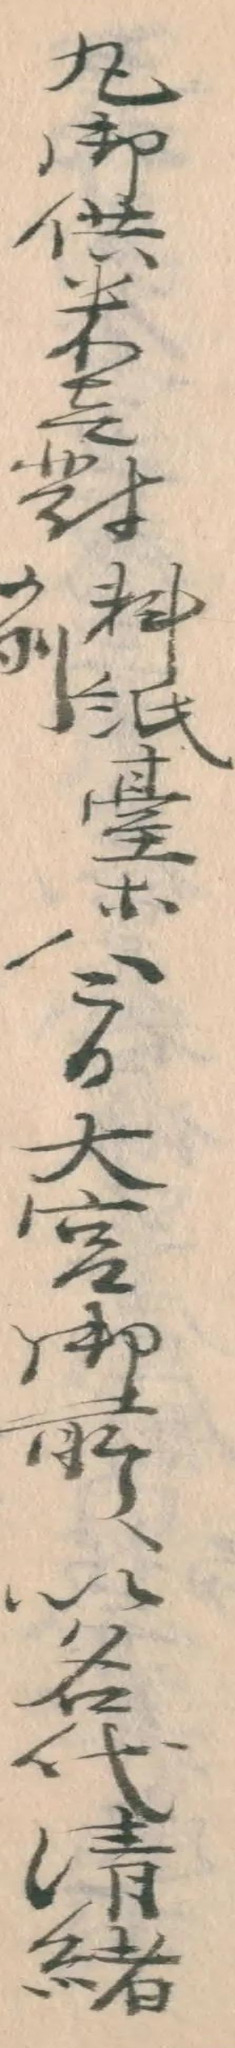丸御供米壱對料紙臺等如例今日大宮御所へ以名代清緒
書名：賀茂社記録. 第72冊
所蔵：国立国会図書館 National Diet Library, JAPAN
